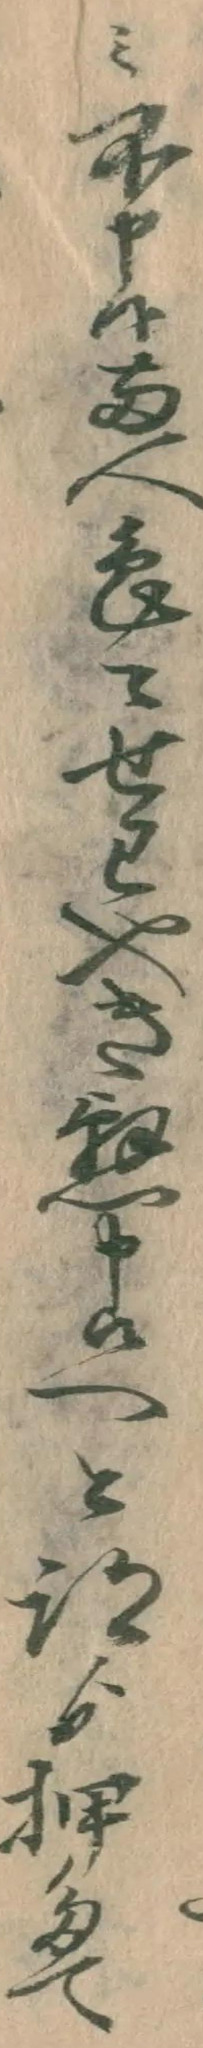み不申候両人色々せ己やき懸申候へと跡ゟ押多て
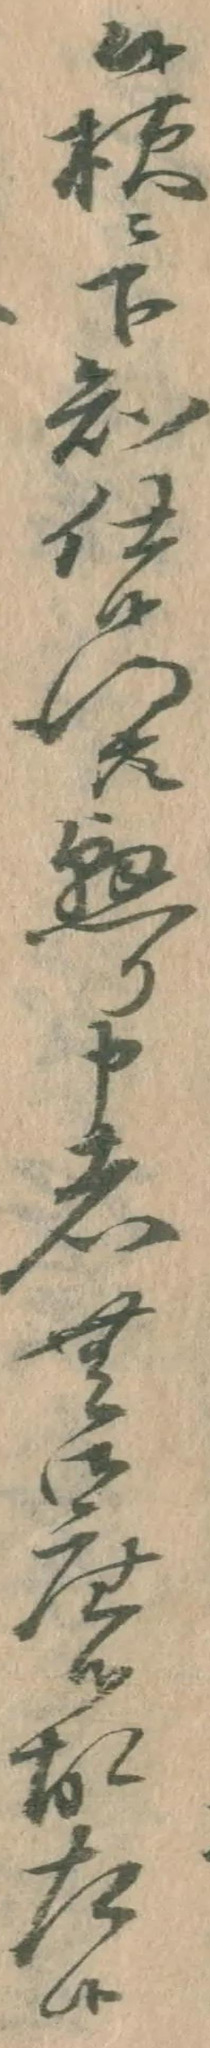候様に下知仕候得共懸り申者無御座候故左候
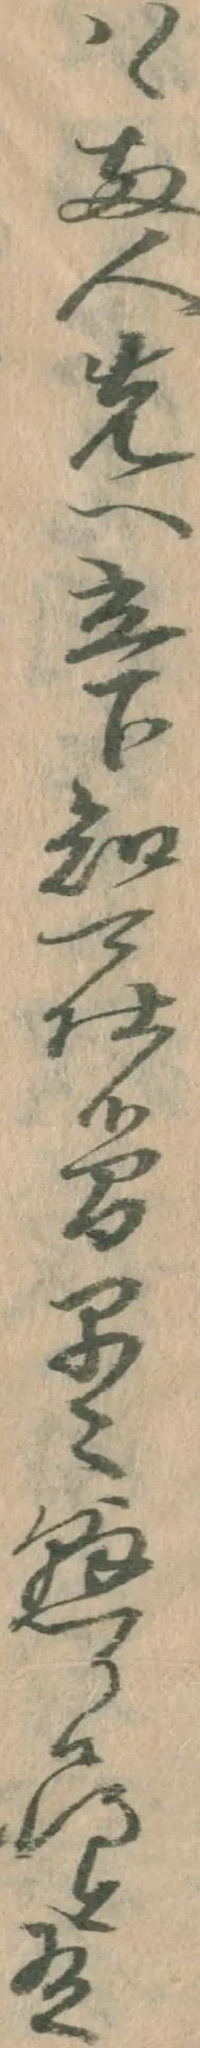はゝ両人先へ立下知可仕候間早々懸り候得と有
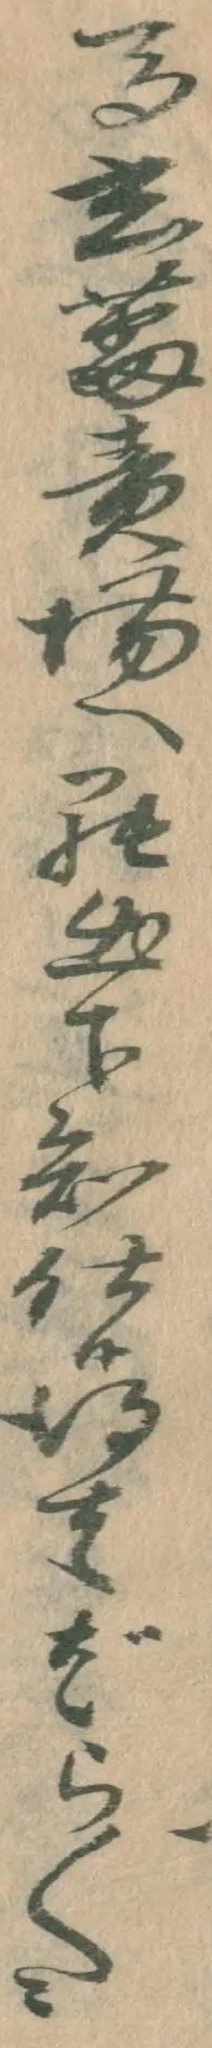馬玄蕃責場へ罷出下知仕候得者ばら〳〵に
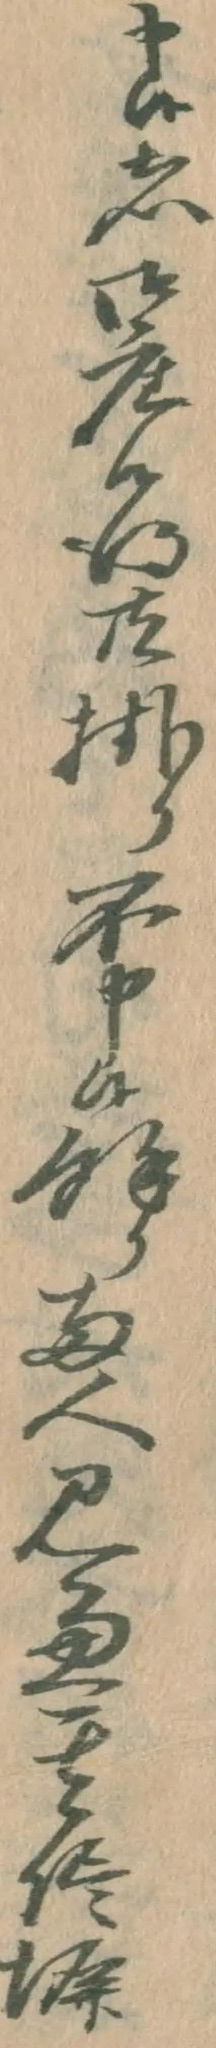申候者御座候得共掛り不申候余り両人見兼其侭塀
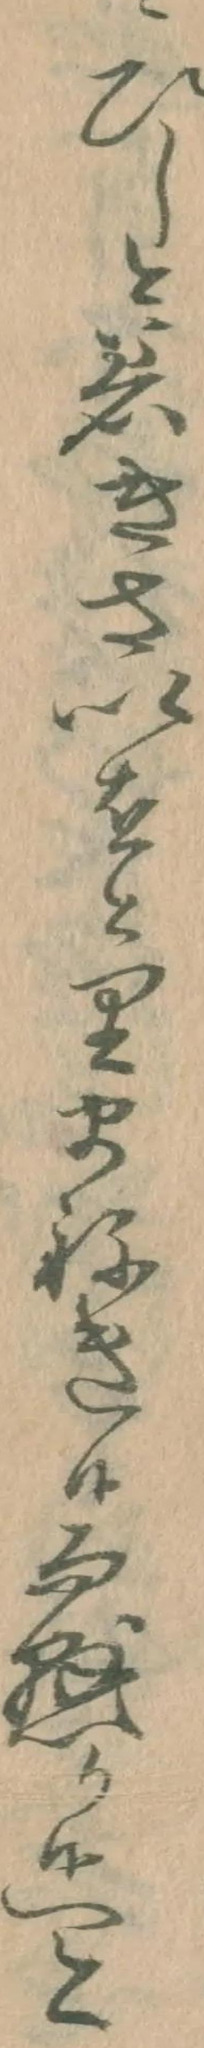にひしと着きさ以をと里ま祢き候而懸り候へと

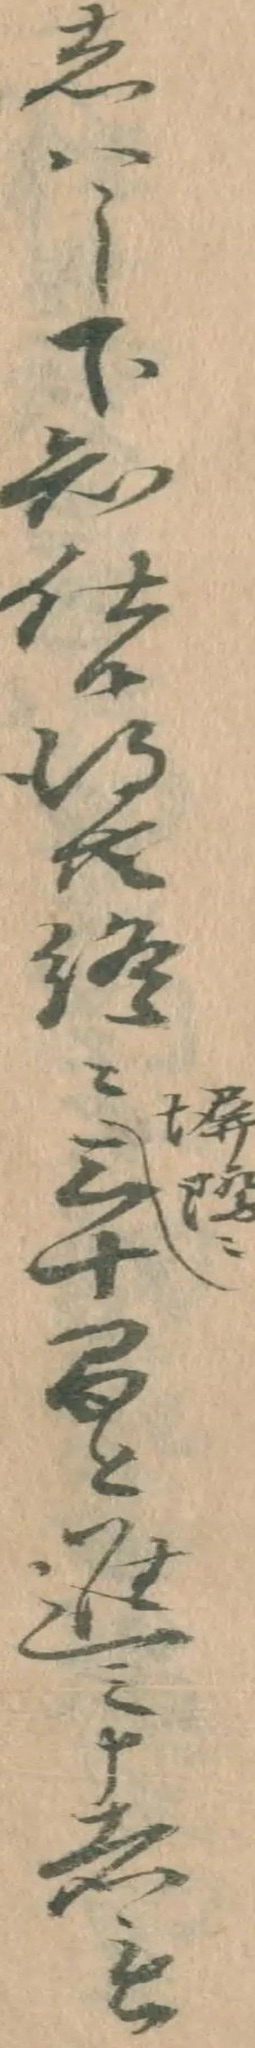者はし下知仕候得共終に三十間と進み申者も
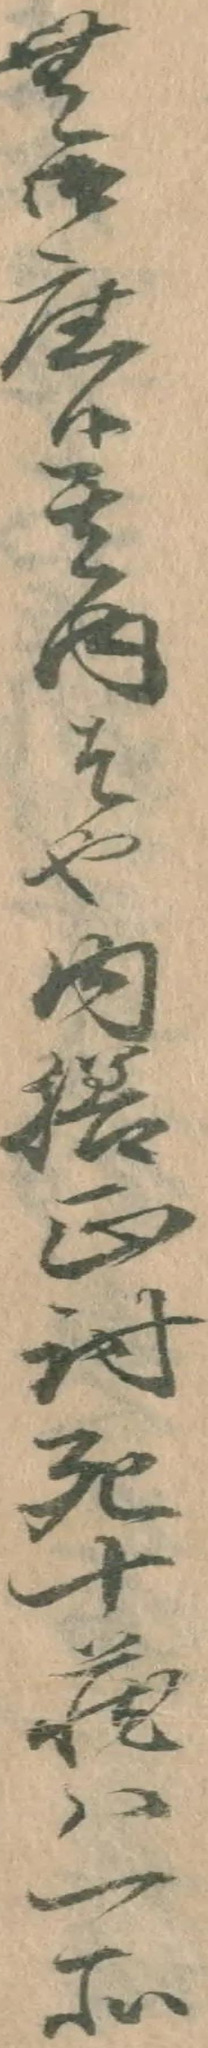無御座候其内者や内膳正討死十蔵は一所
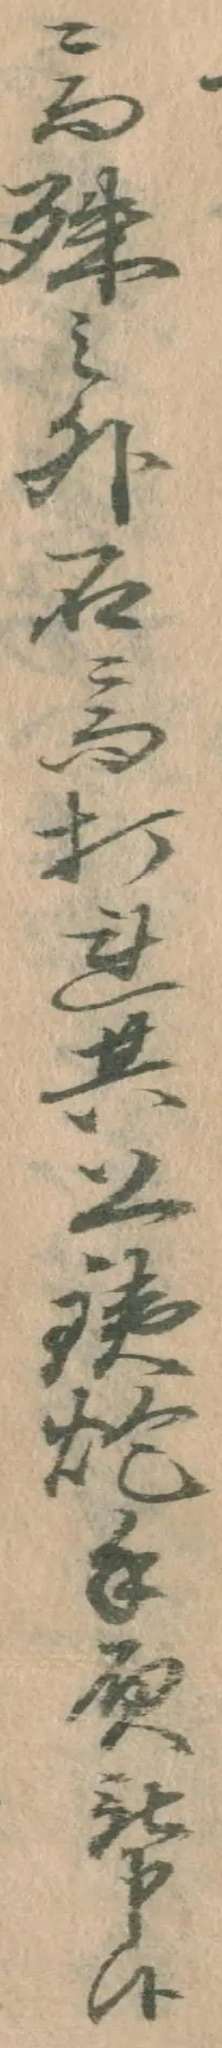に而殊之外石に而打連其上鉄砲手負被申候
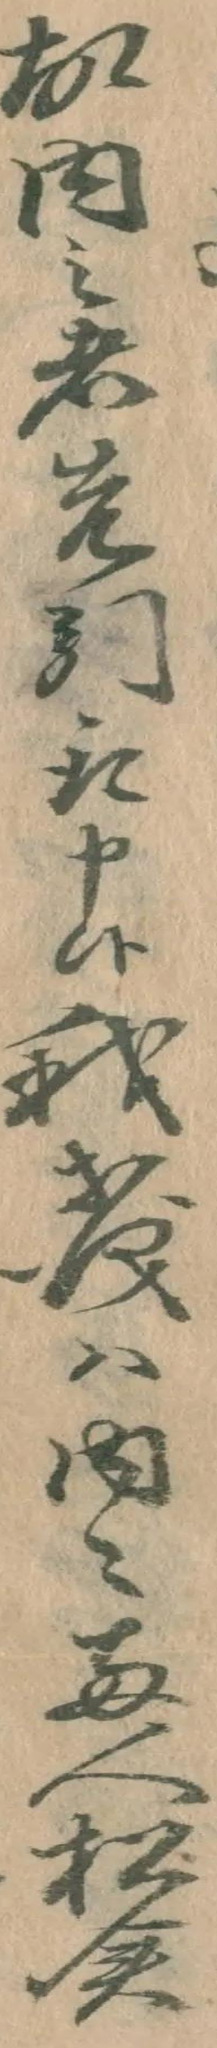故内之者先引取申候我等儀は内に両人松倉
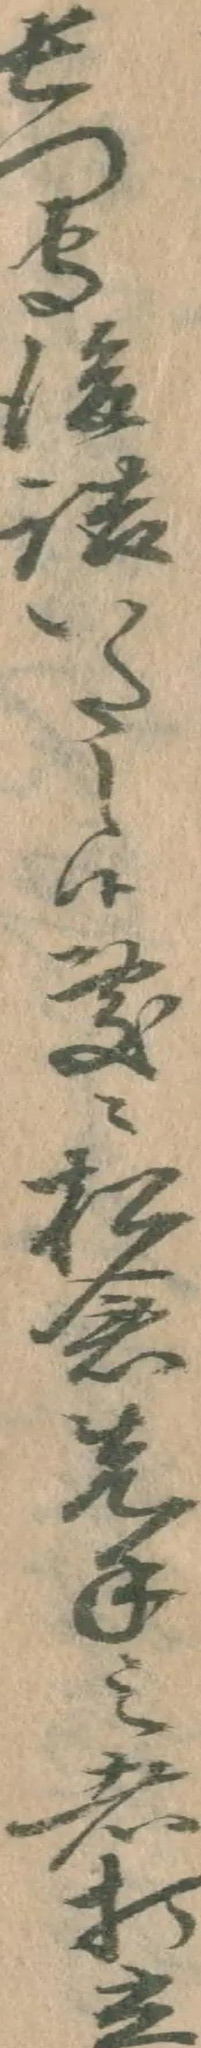長門守後詰いたし候處に松倉先手之者打立
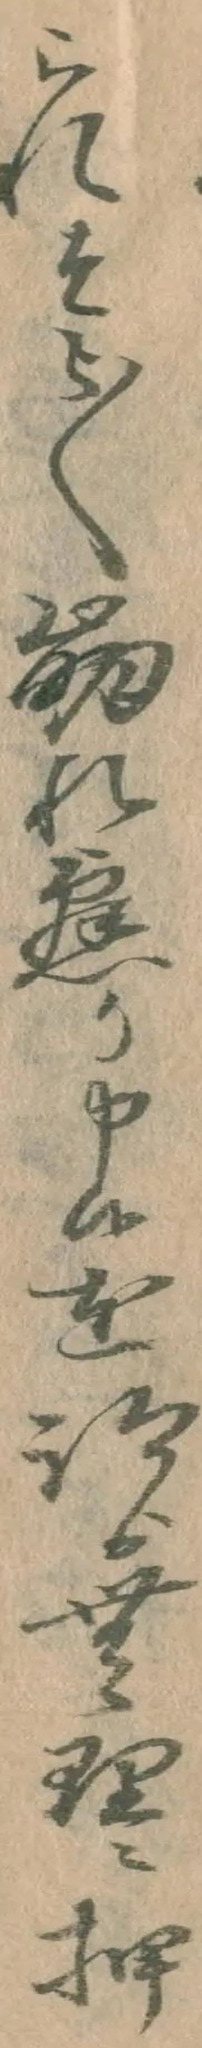られ者与〳〵崩れ懸り申候を跡ゟ無理に押
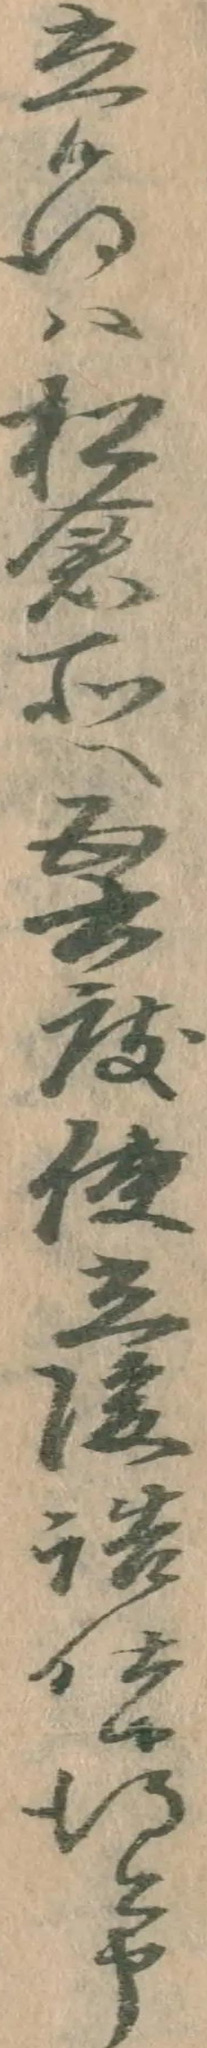立候得は松倉所へ五六度使立後詰仕候得と申
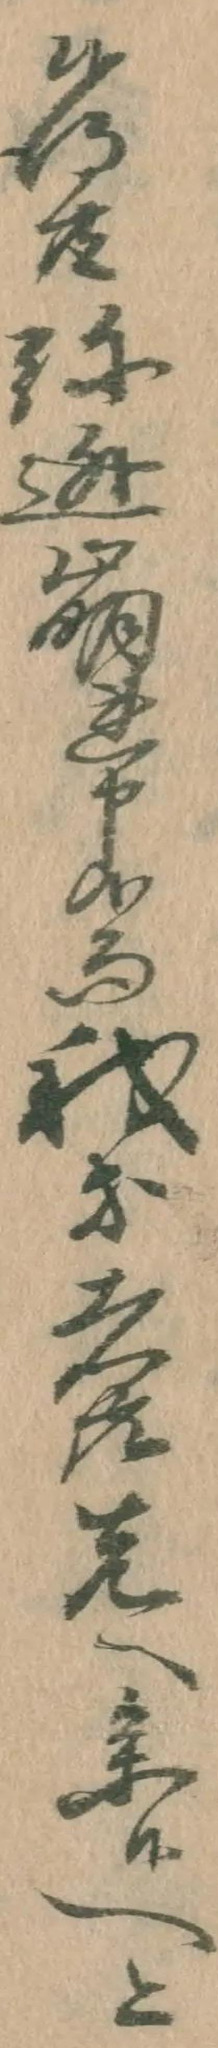候得共弥逃崩連申候而我等者共先へ参候へと
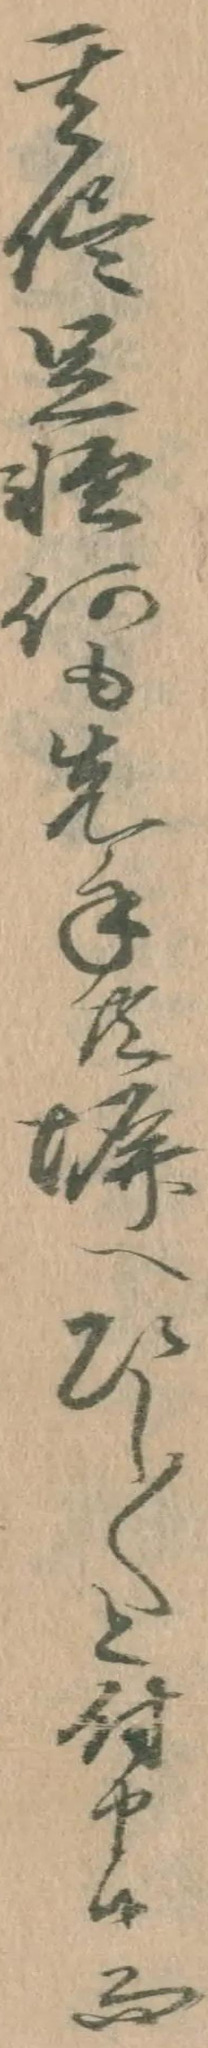其侭足軽何も先手共塀へひし〳〵と付申候而
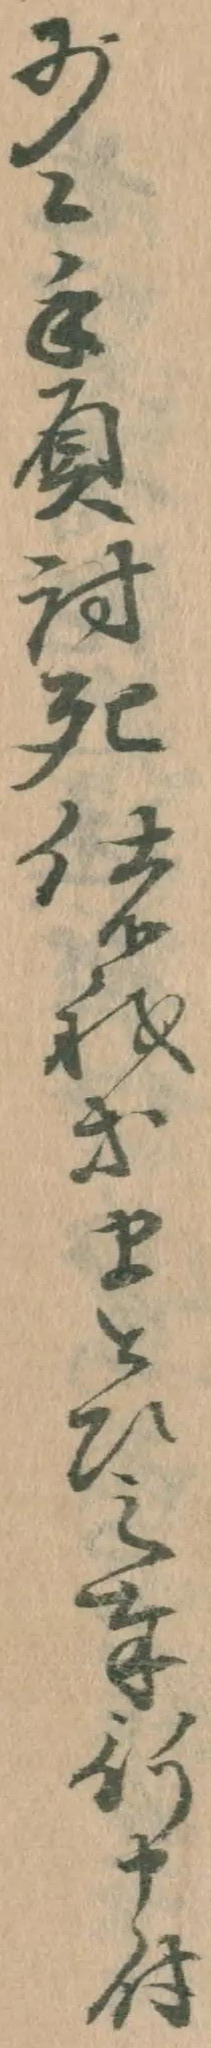少々手負討死仕候我等まとひ之奉行申付
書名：切支丹御退治記 49巻. [5]
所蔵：国立国会図書館 National Diet Library, JAPAN
